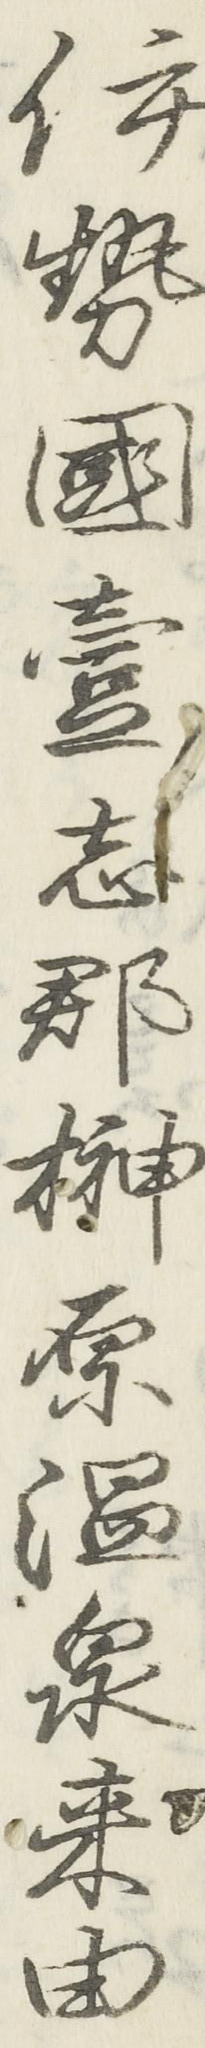伊勢国壱志郡榊原温泉来由
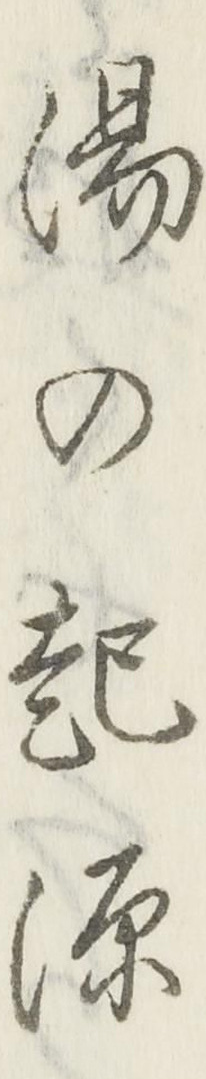湯の起源
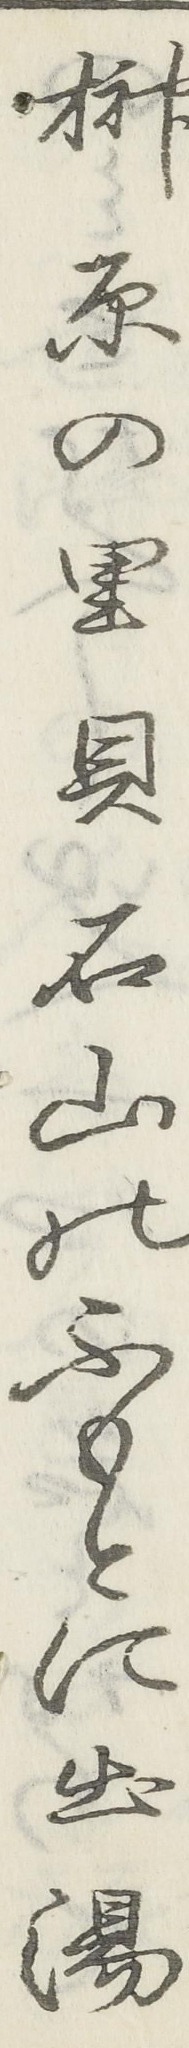榊原の里貝石山のふもとに出湯
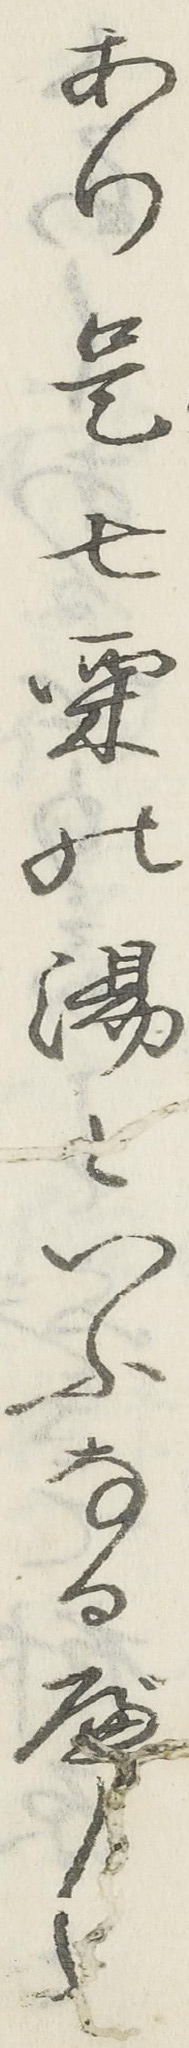あり是七栗の湯といふなるべし
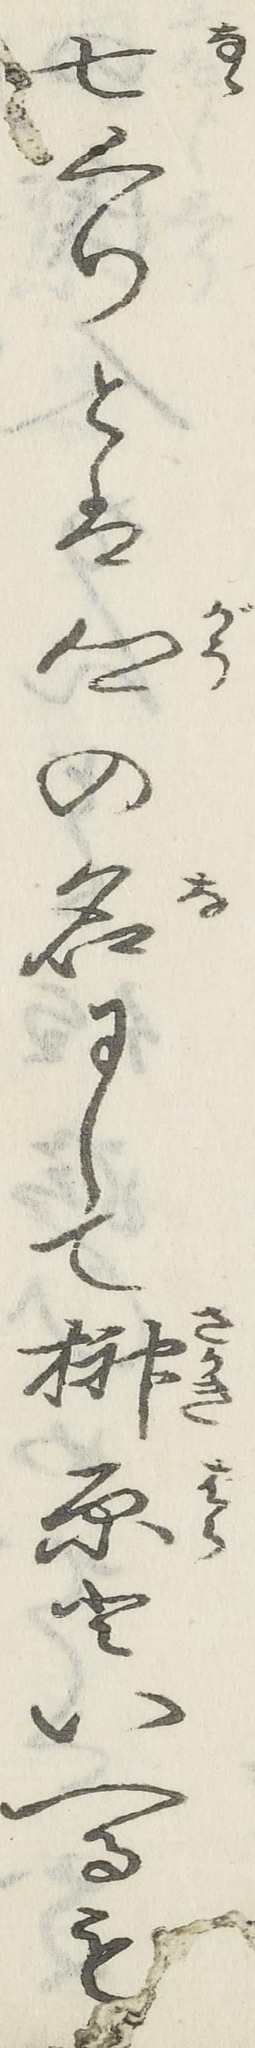七くりとは郷の名にして榊原といへるも
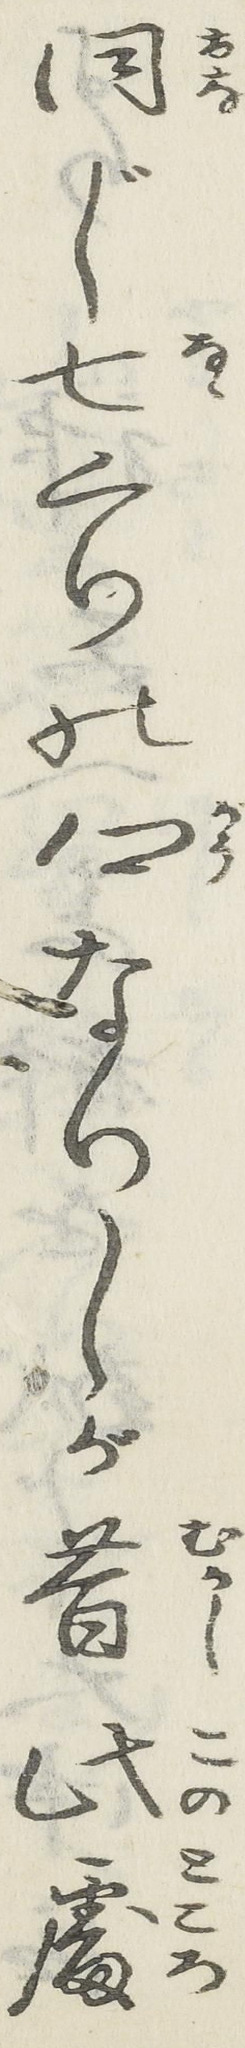同じ七くりの郷なりしが昔此處

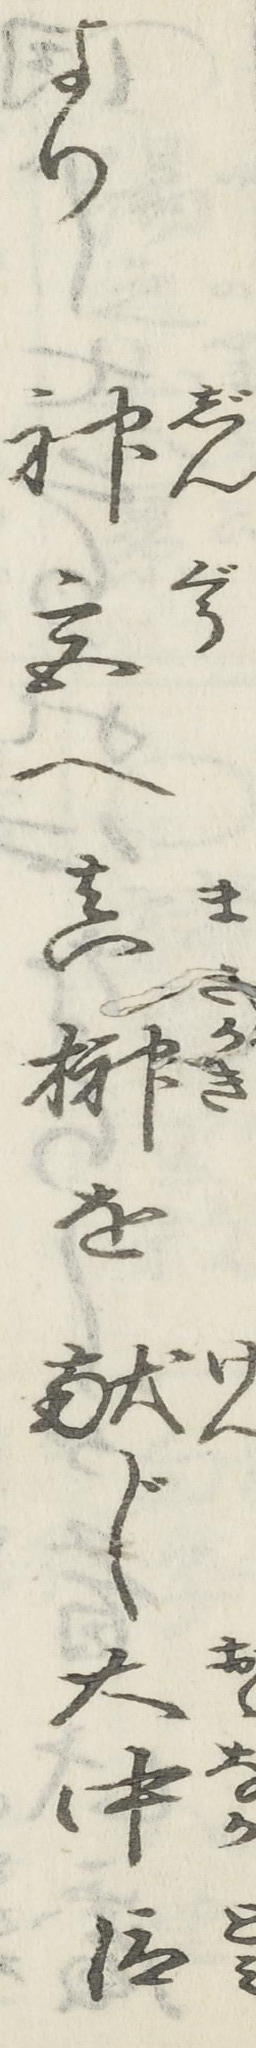より神宮へ真榊を献じ大中臣
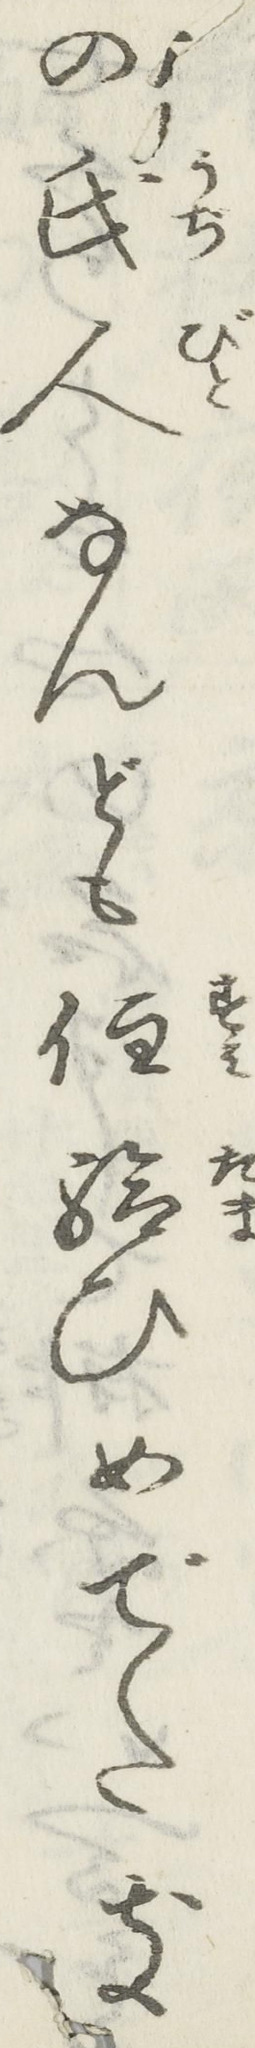の氏人なんども住給ひめでたき
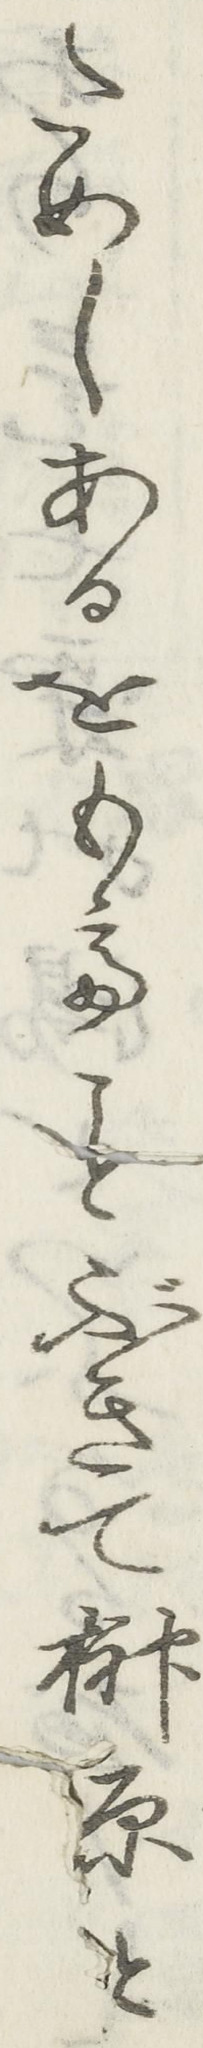ためしあるをもてことぶきて榊原と
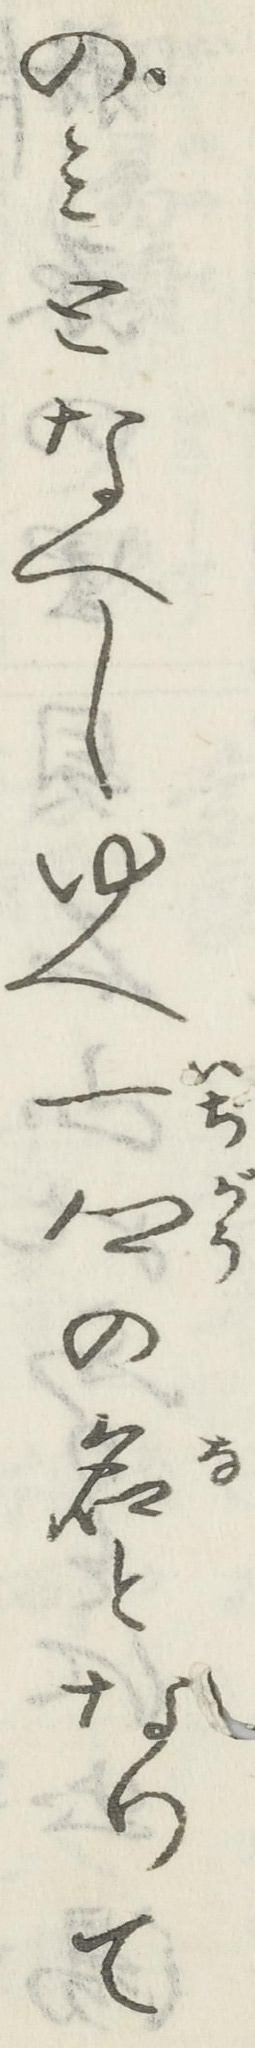のみとなへしゆへ一郷の名となりて
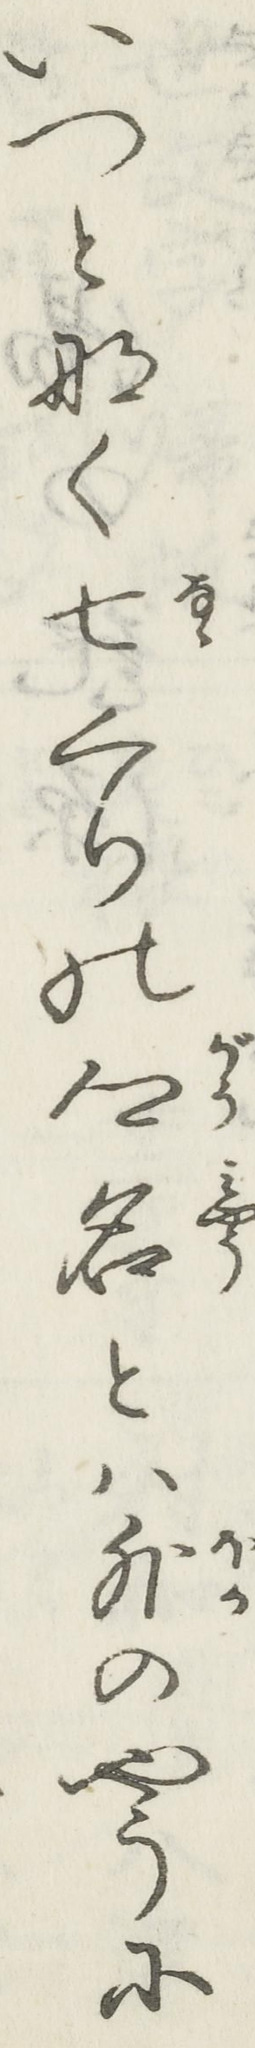いつとなく七くりの郷名とは外のやうに
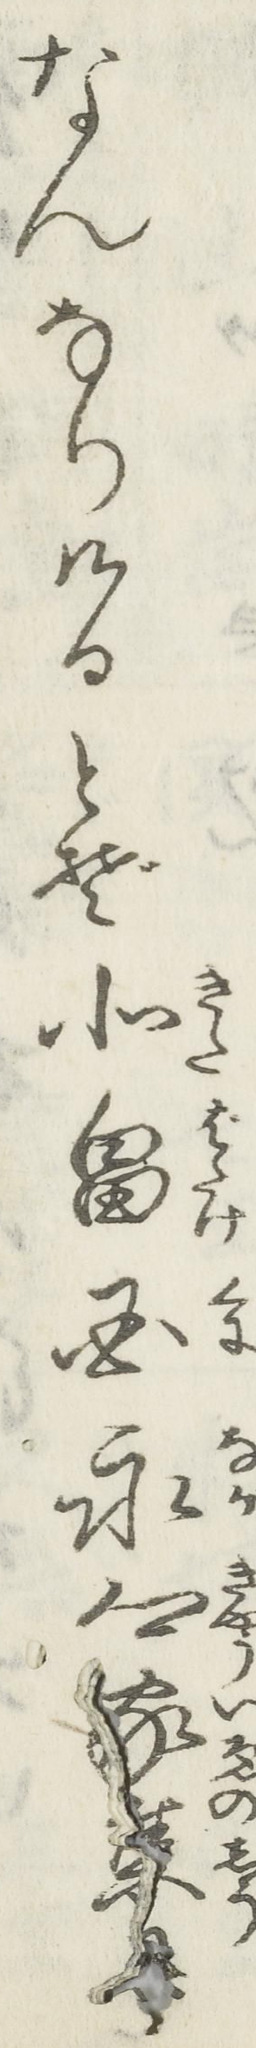なんなりけるとぞ北畠国永卿家集に？
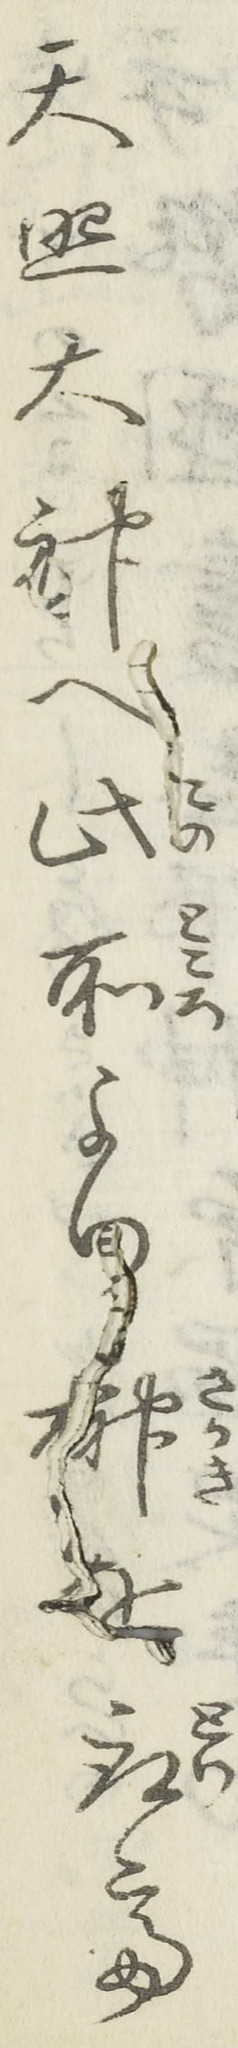天照大神へ此所より榊を取て
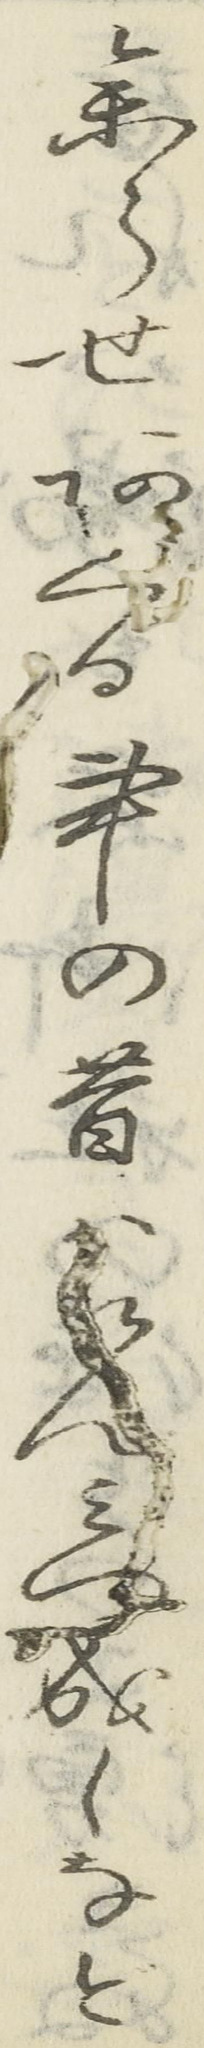参らせあぐる事の昔ハけんみつ成しなど
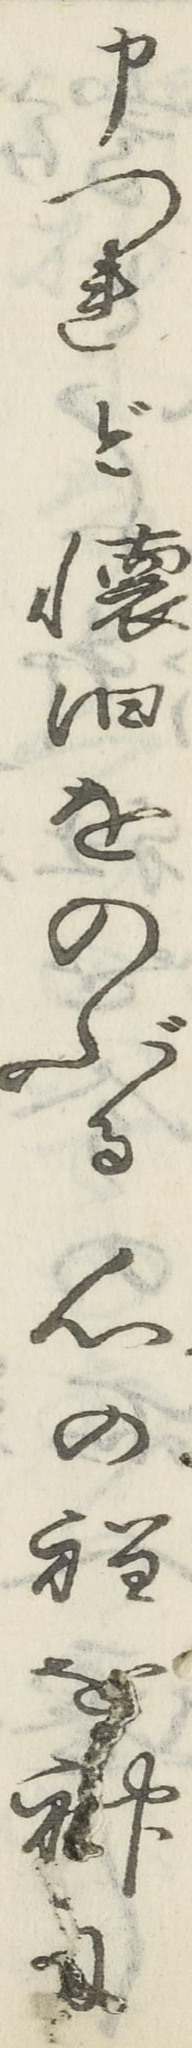申つれど懐旧をのぶる心の程を神に
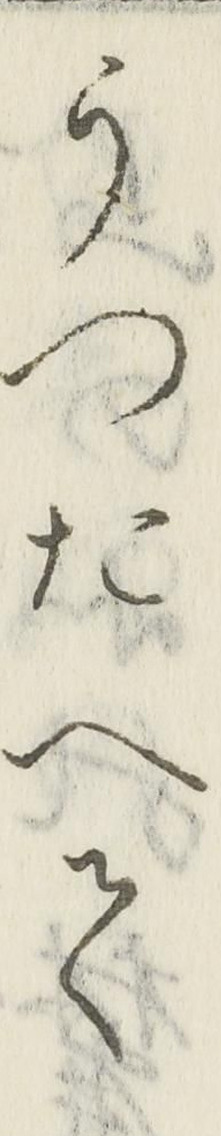うつたへて
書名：温泉来由記
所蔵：東京大学地震研究所図書室 Earthquake Research Institute Library, The University of Tokyo, JAPAN
